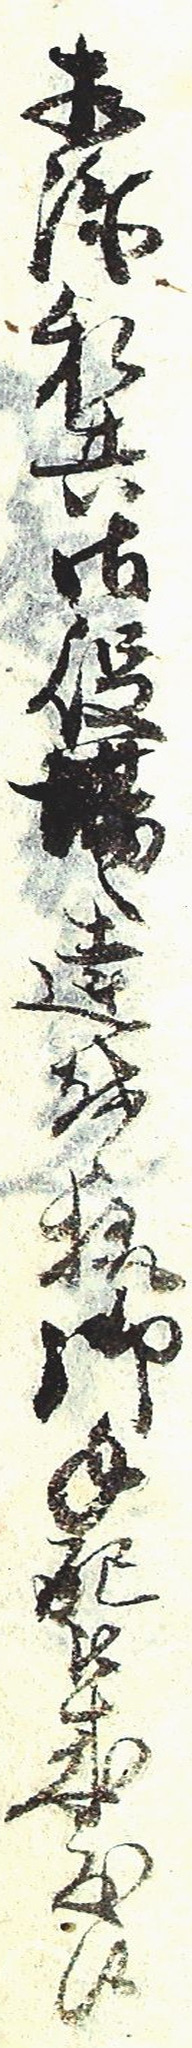相添私共御役場へ達越候様御手配被成度候
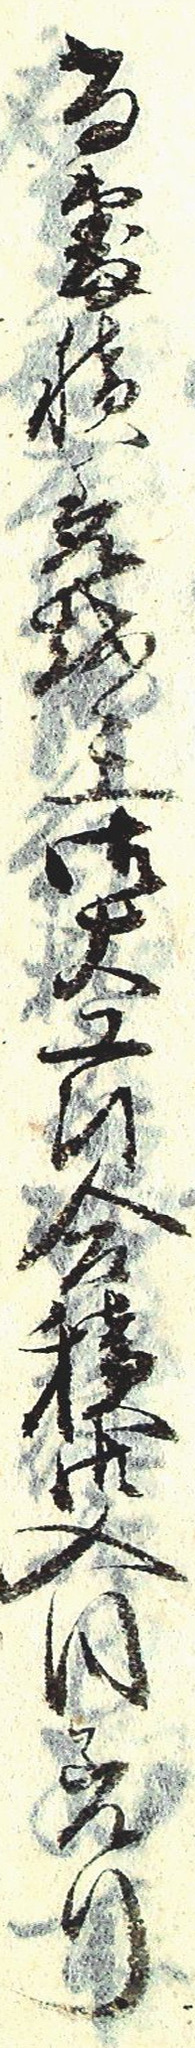尚処積差越候上御大工引合積御入用差引
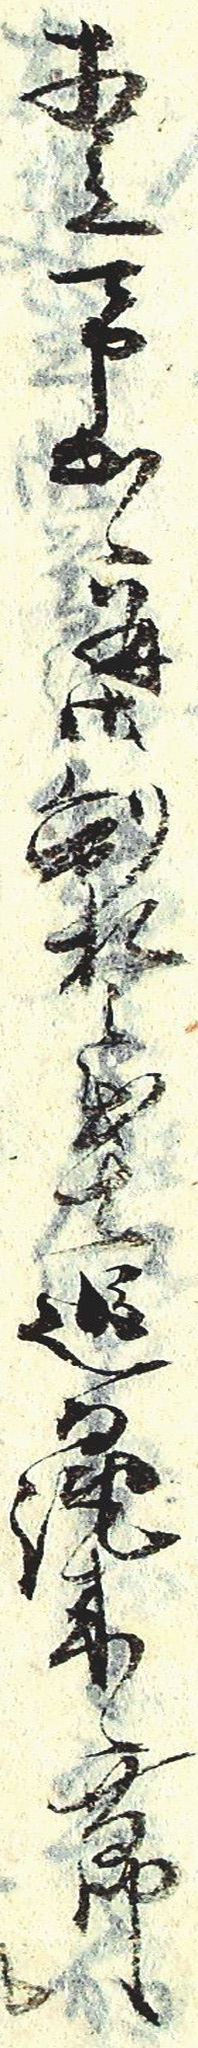相立可申出候并御制札之義は追て詫来候節
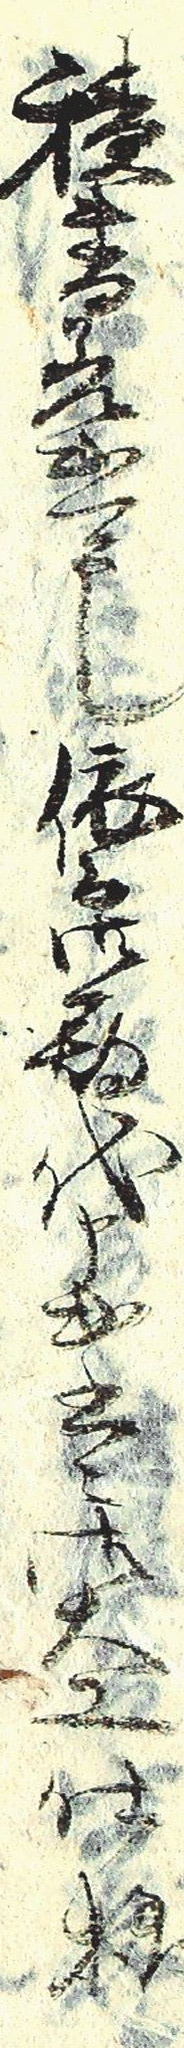積書差出可申候依て御郡代申出書に御大工仕様
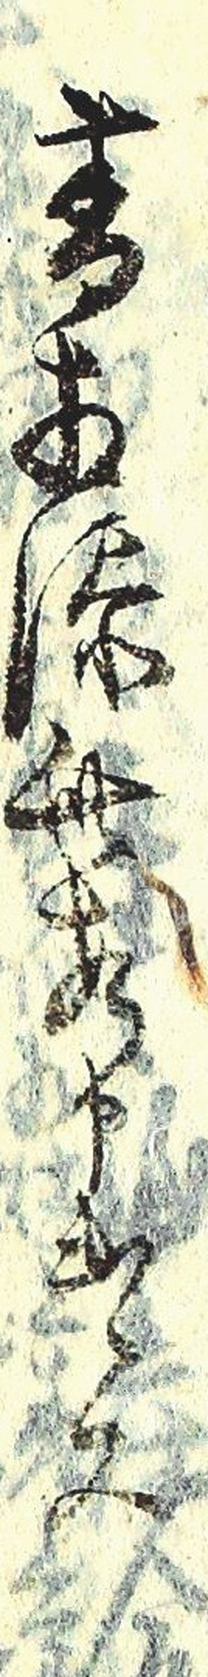書相添此段申出候以上
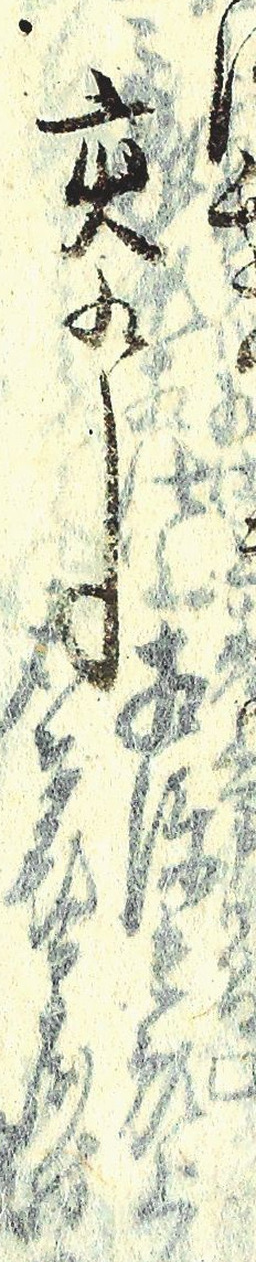亥九月
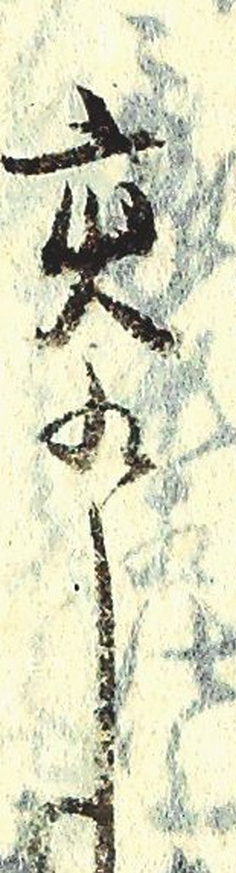亥九月
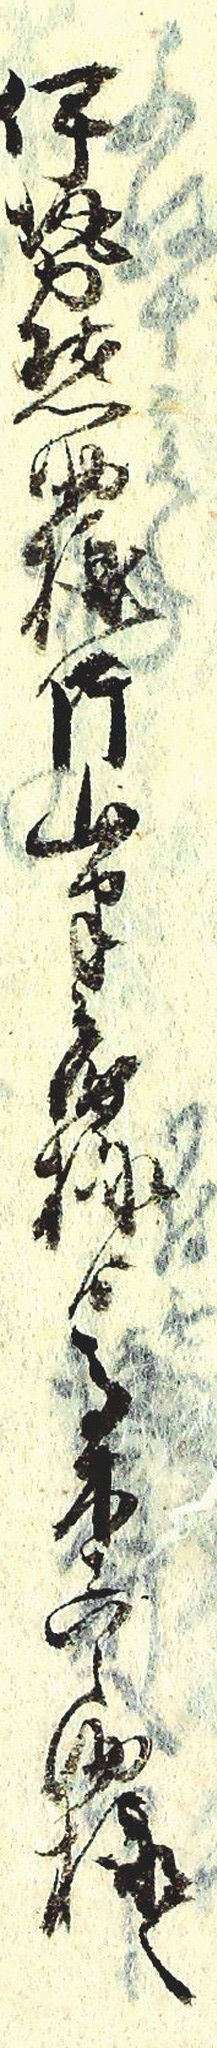伊勢然助様片山半兵衛様ゟ高木真之助様へ
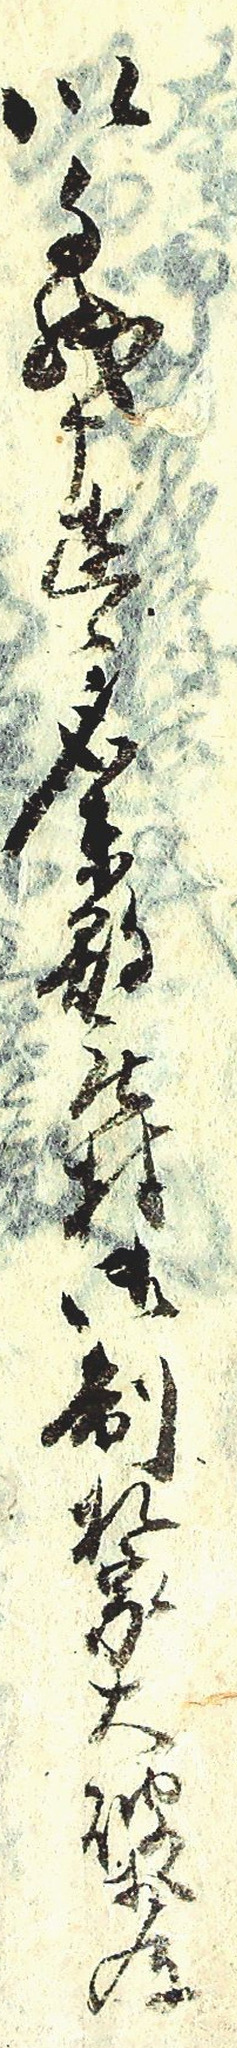以手紙申達候名東郡庄村御制札家大破に相及
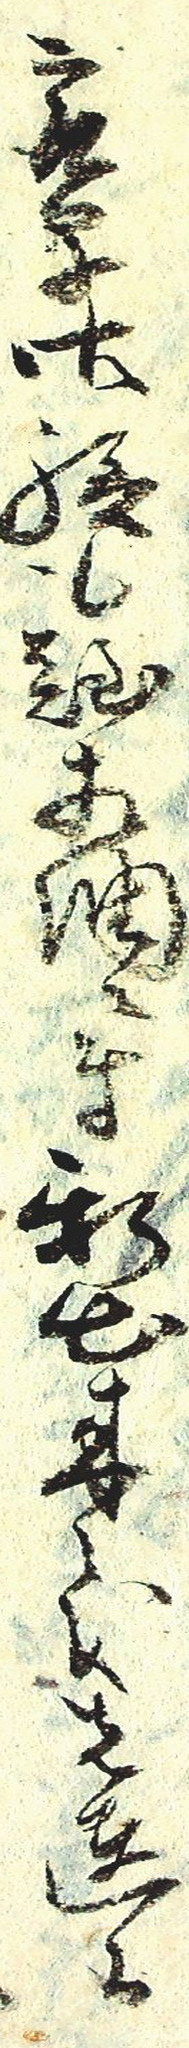最早御繕も難相調に付新出来之義先達て
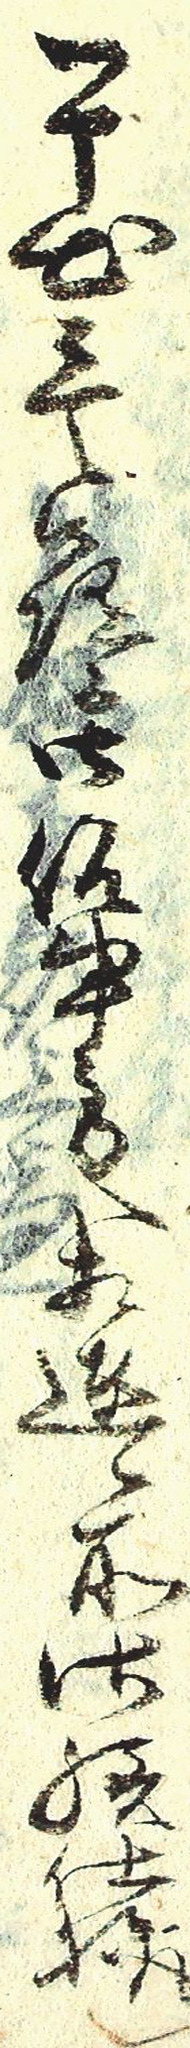御申出有之候随て御作事方へ相達候所御繕仕様
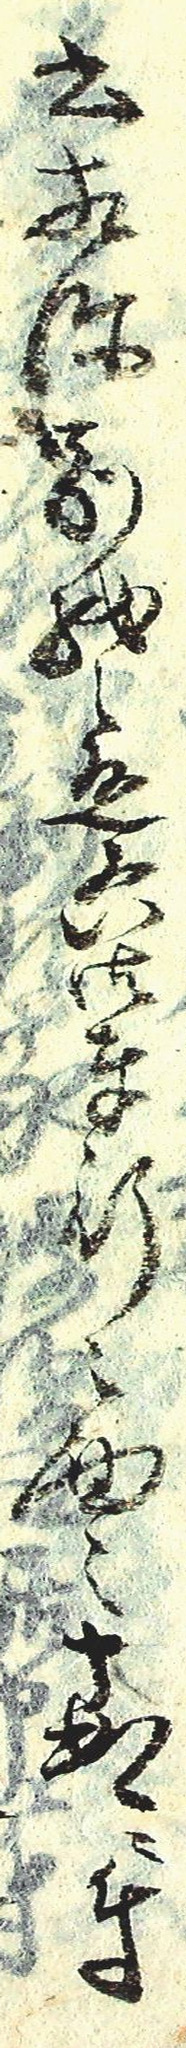書相添別紙之通右御奉行之面々申出候に付
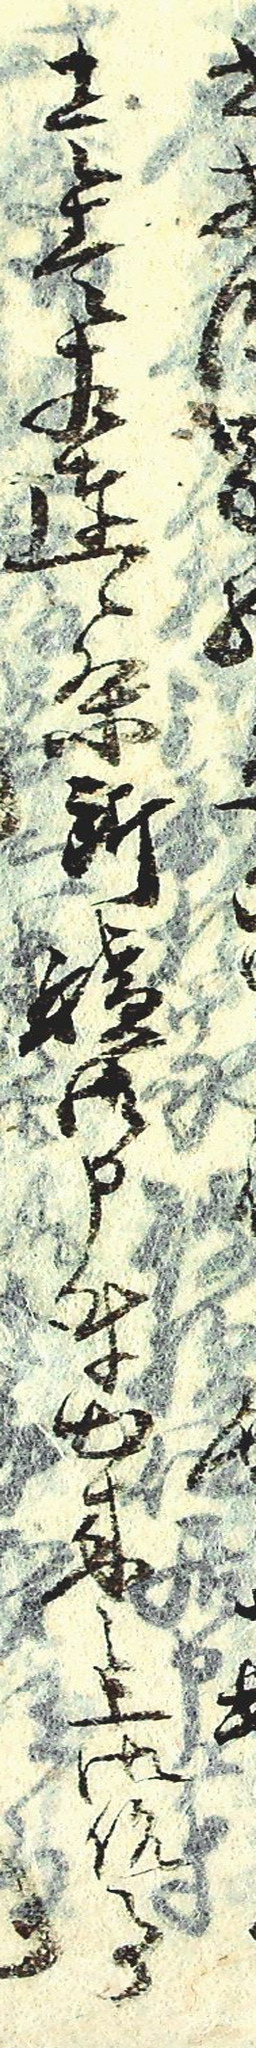壱壱相達候条所積御申付出来之上御作事
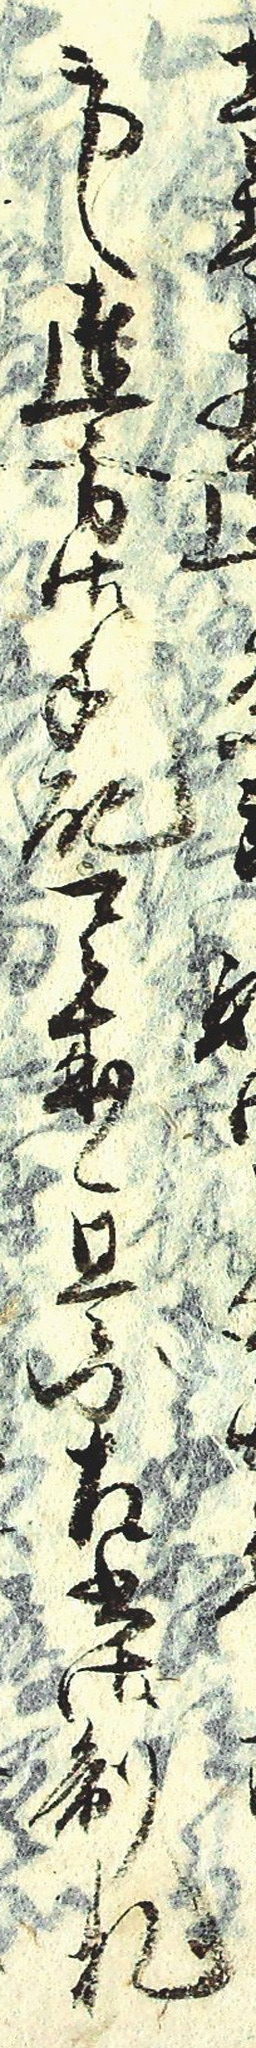方へ達方御手配可被成候且亦左書御制札
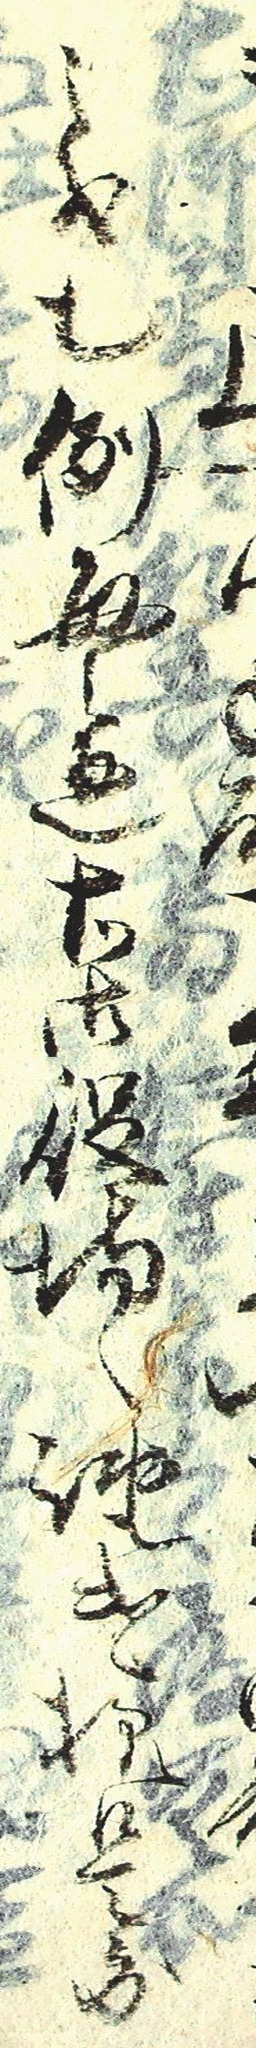之義も例毎之通右御役場へ詫出候様是亦
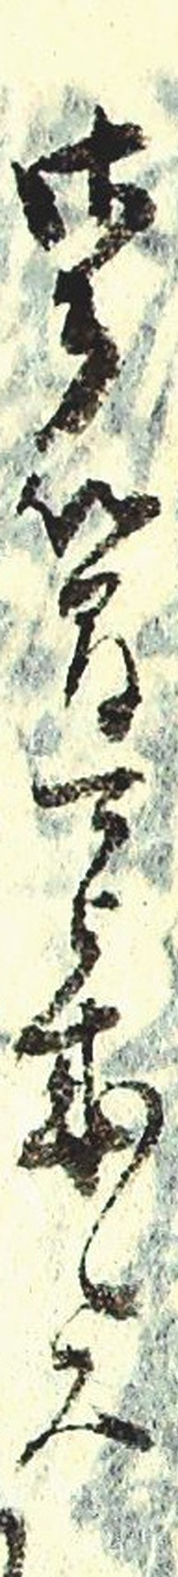御了簡可被成候以上
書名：諸御願書控(弐番）
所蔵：鳴門教育大学 Naruto University of Education
